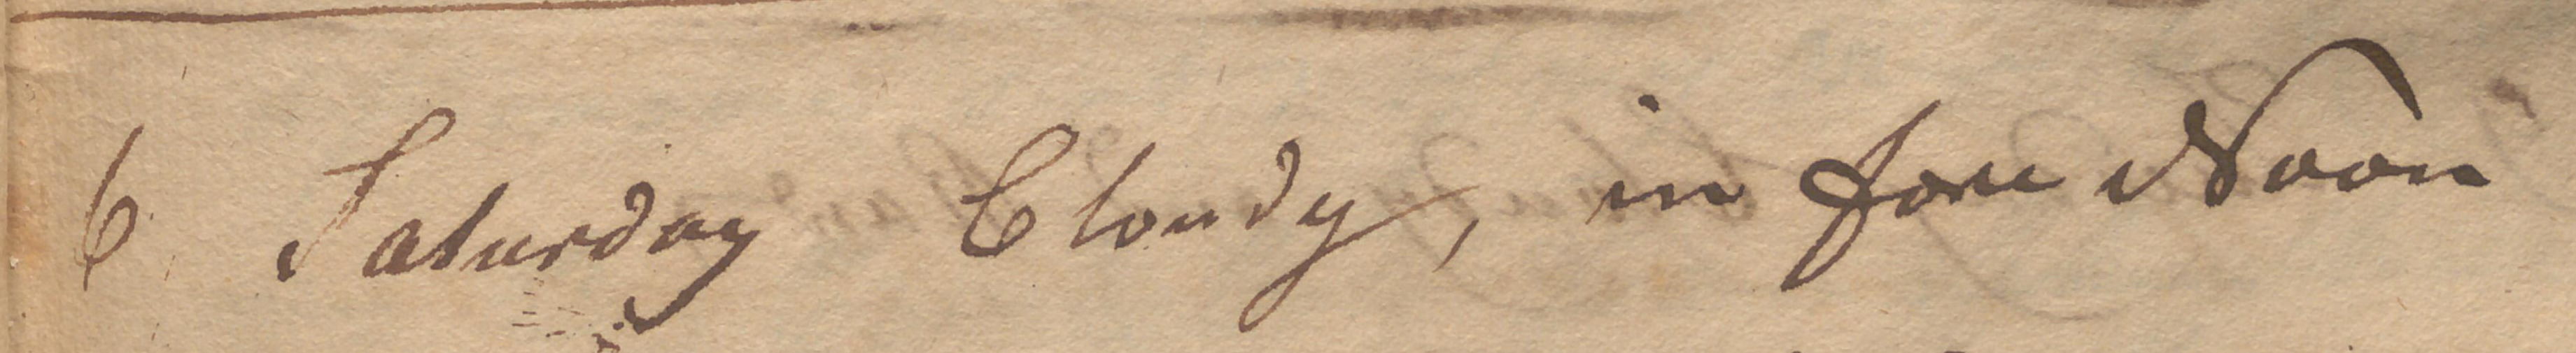6 Saturday Cloudy, in fore Noon
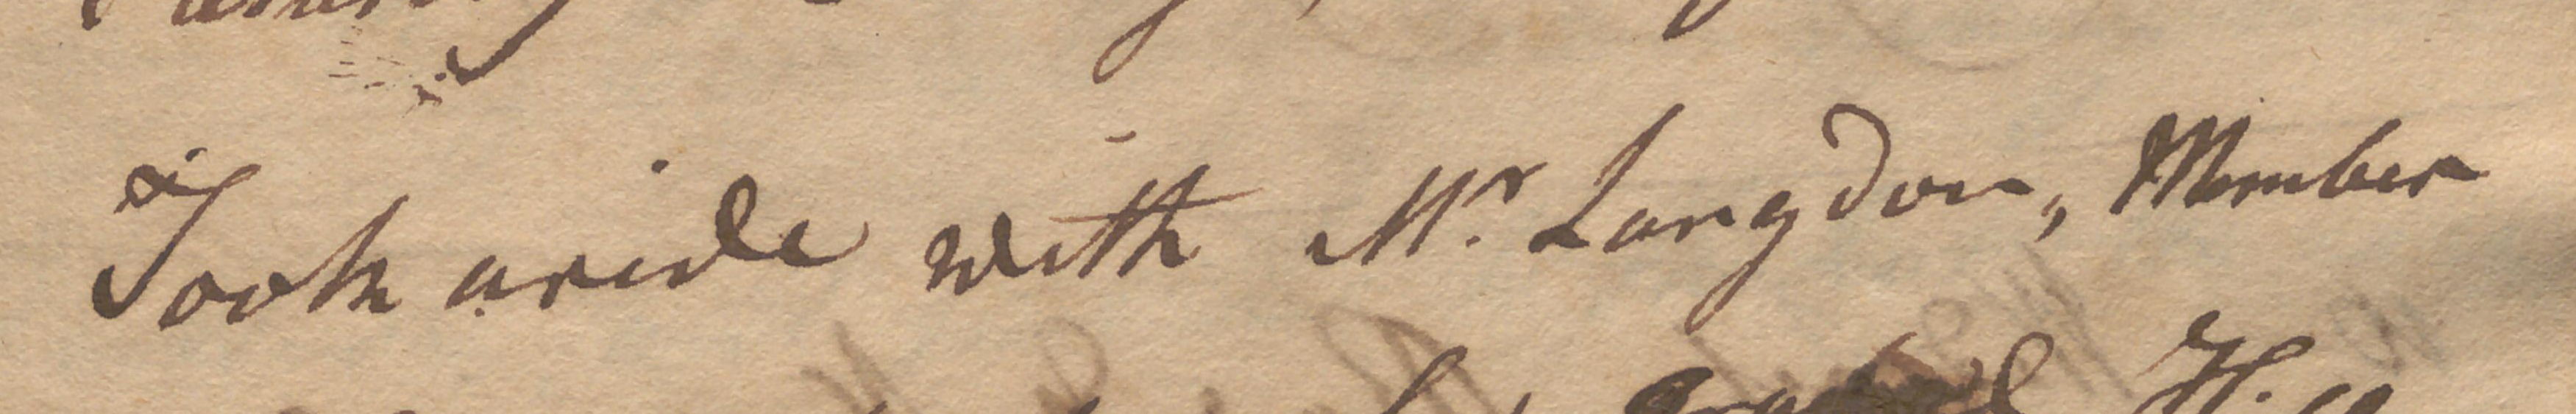Took a ride with M^r. Langdon, Member
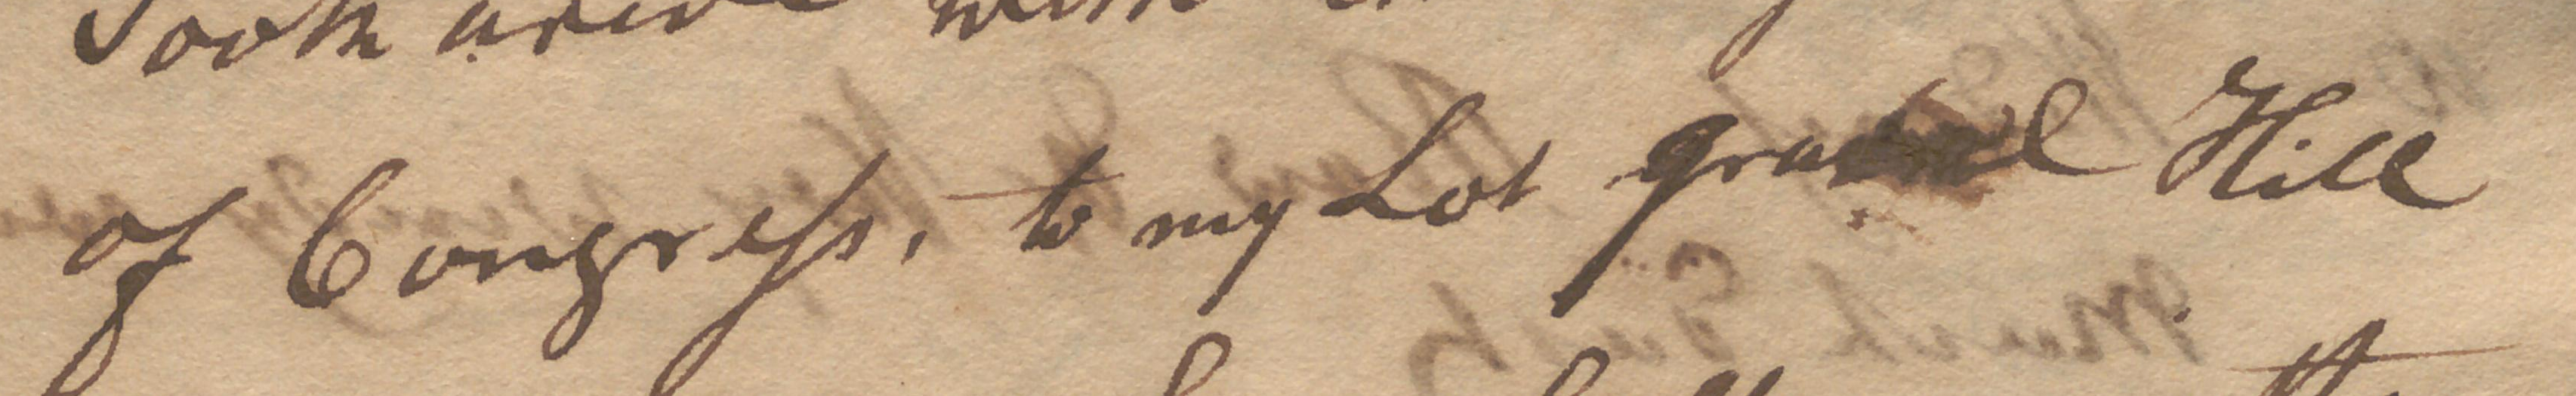of Congress, to my Lot gravel Hill
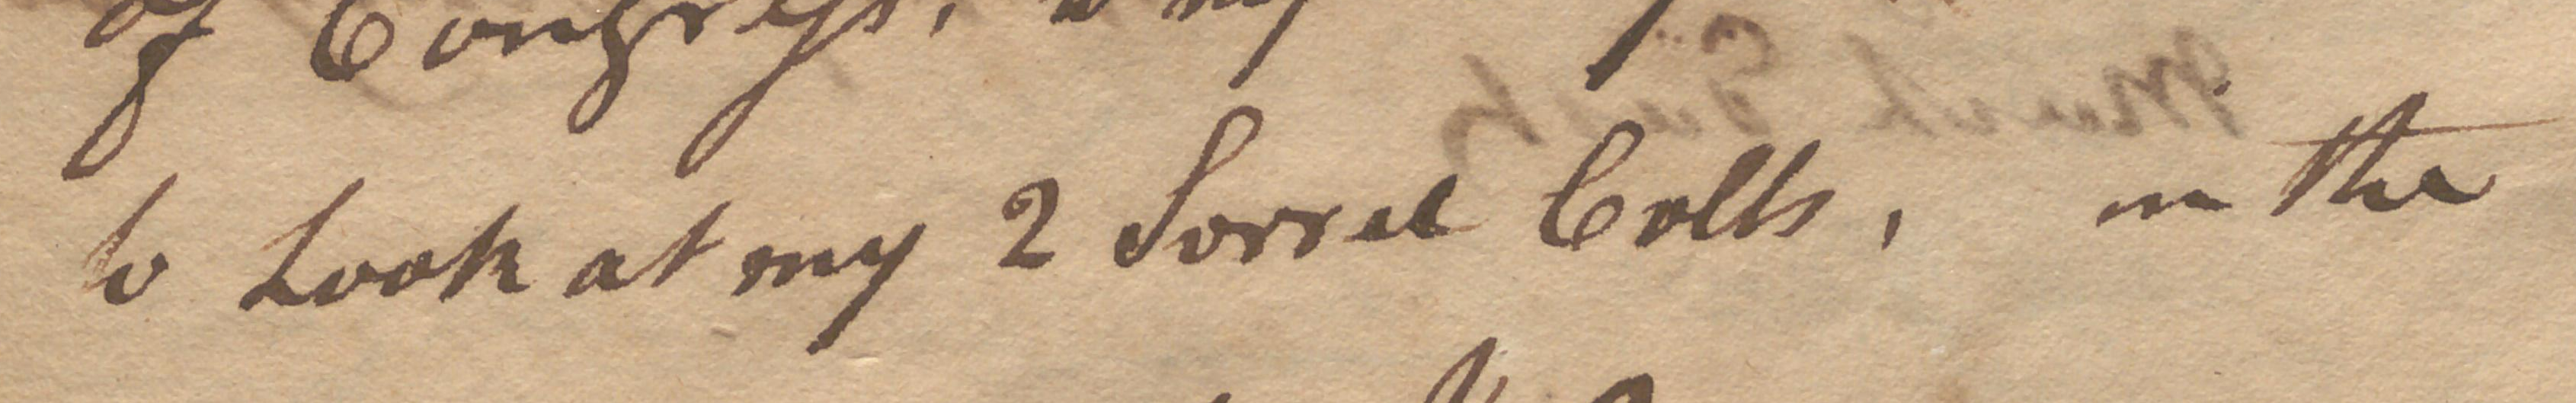to Look at my 2 Sorrel Colts, in the
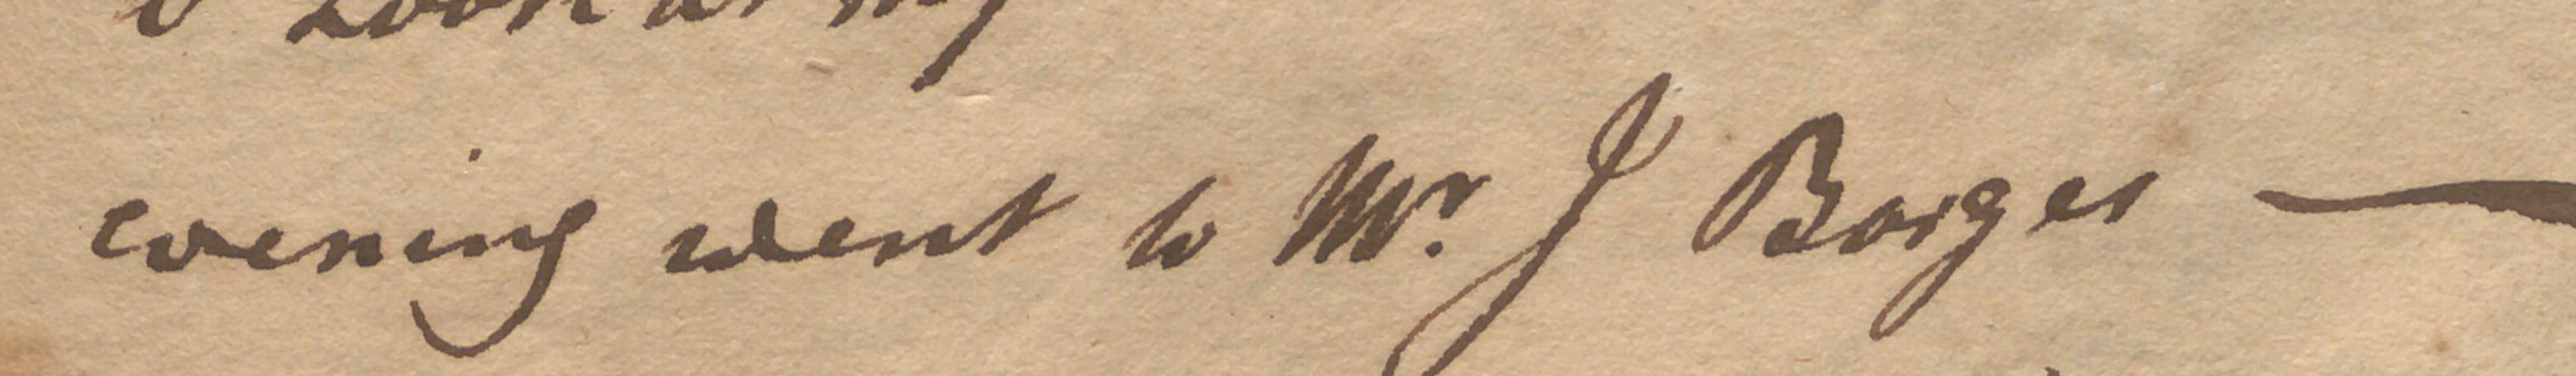evening went to M^r. J Barges-
